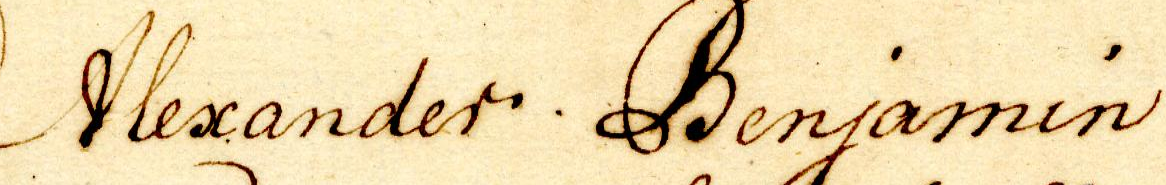Alexander Benjamin
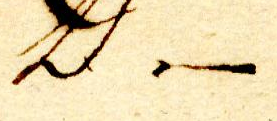D^r
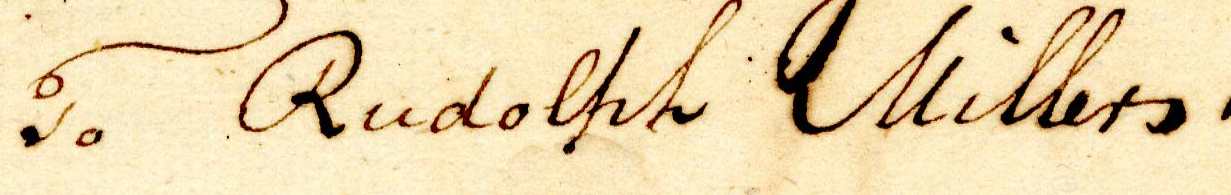To Rudolph Millers
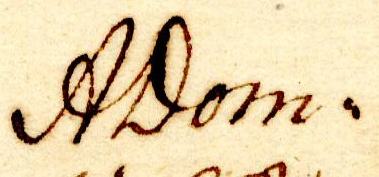A Dom.
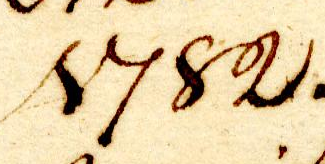1782
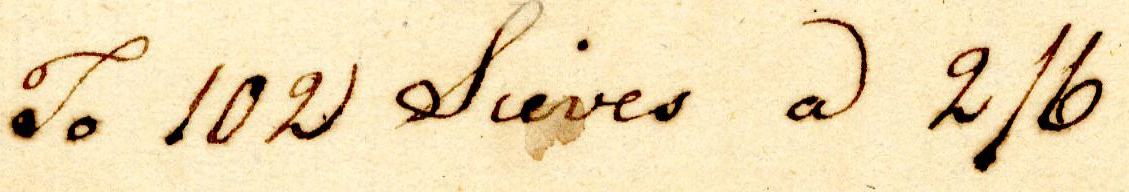To 102 Sieves @ 2s6
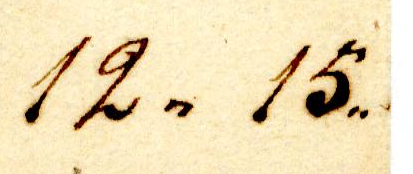12.. 15..
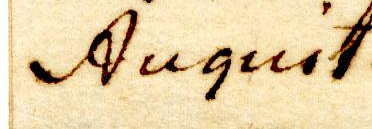August
